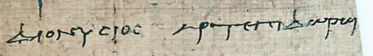διονυϲιοϲ αρτεμιδωρωι
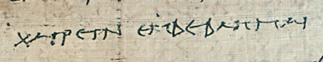χαιρειν εμβεβλημαι
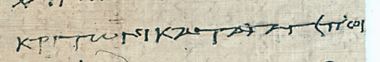κριτωνικαταγαγεινϲοι
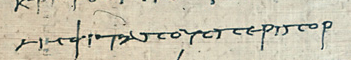αμφιταπουϲπεριπορ
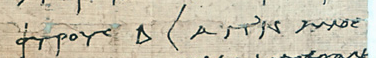φυρουϲ β 〈 αμνν αλλοϲ
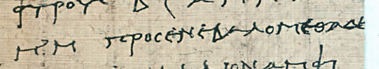μνμ προϲενεβαλομεθαδε
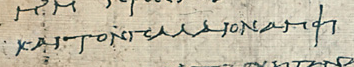καιτονπαλαιοναμφι
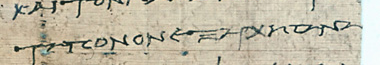ταπονονεξαρχηϲανα
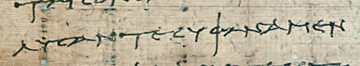λυϲαντεϲυφαναμεν
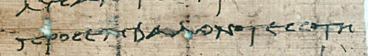προϲεμβαλοντεϲϲτη
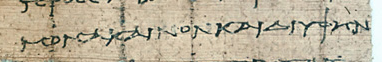μονακαινονδιυφην
